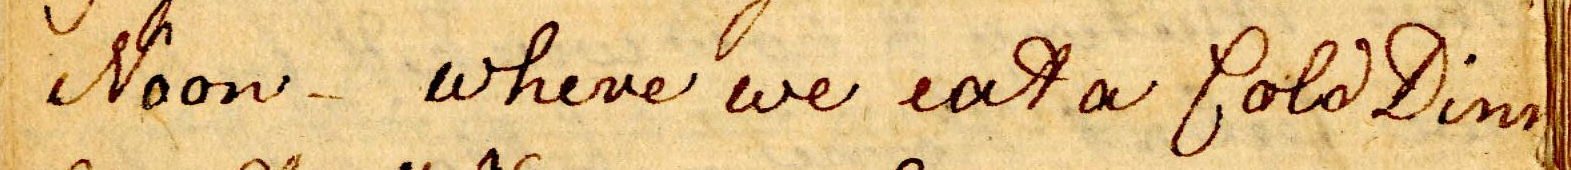Noon- where we eat a Cold Dinn
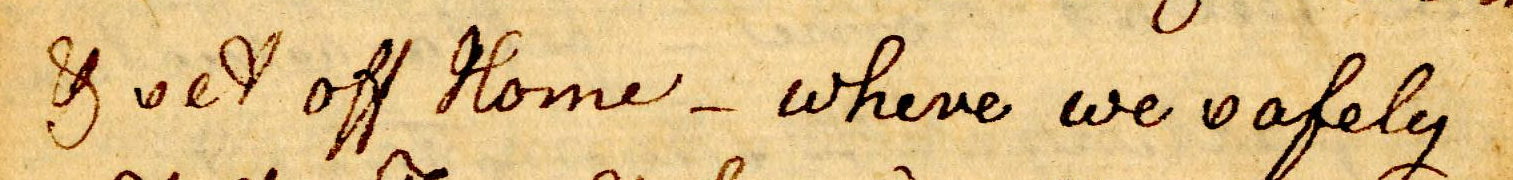& set off Home- where we safely
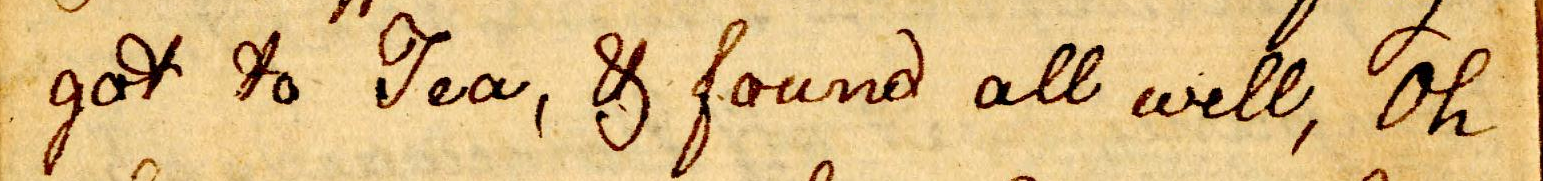got to Tea, & found all well, Oh
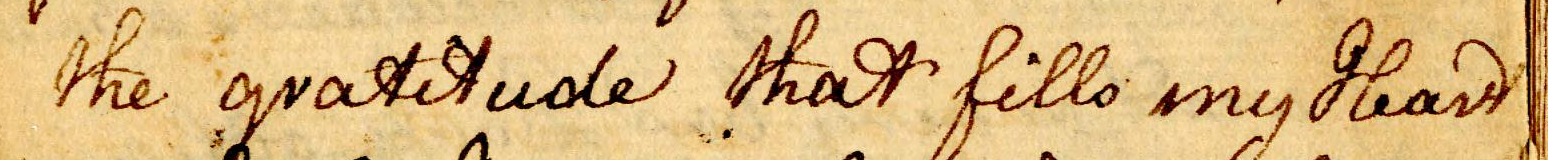the gratitude that fills my Heart
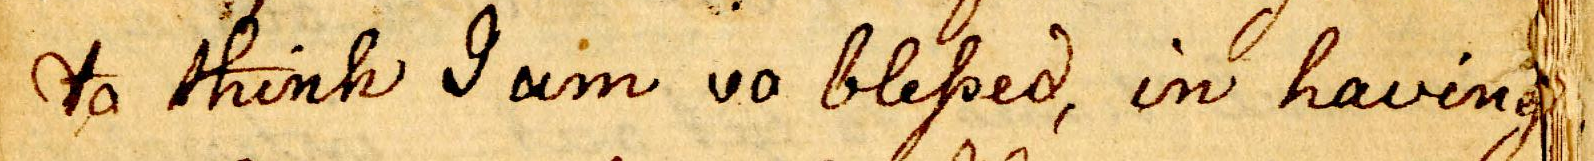to think I am so blessed, in having
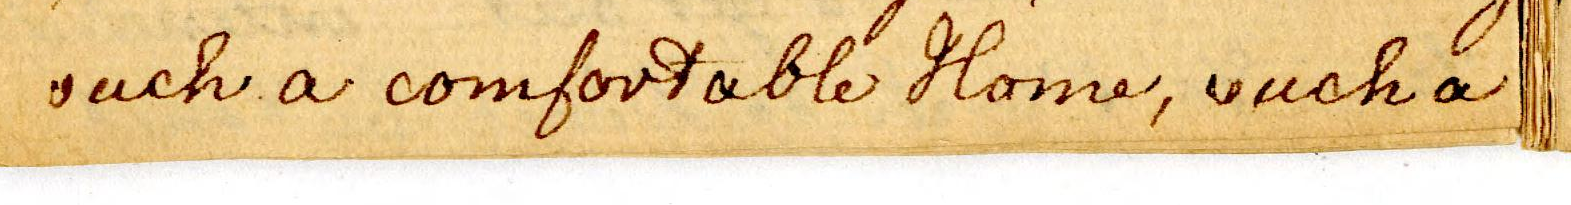such a comfortable Home, such a
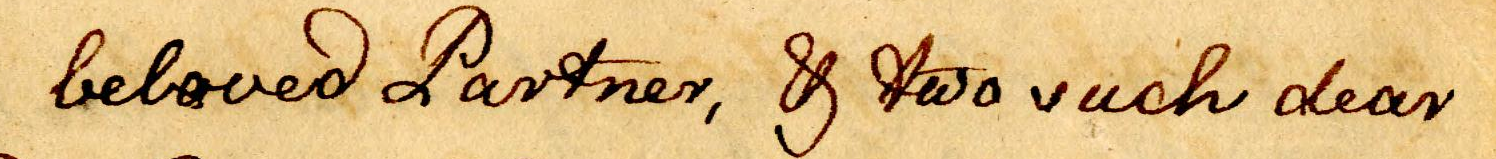beloved Partner, & two such dear
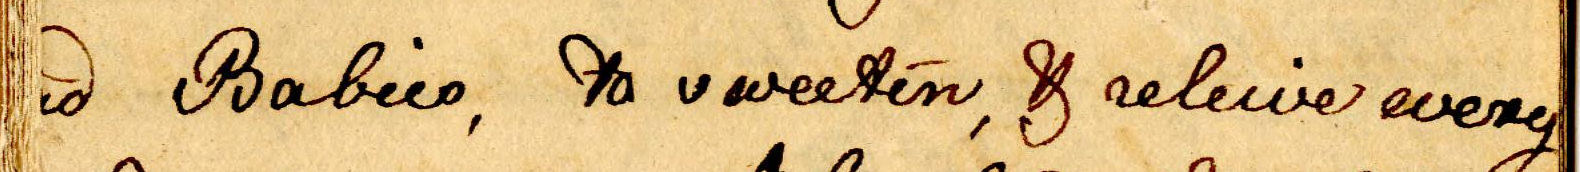d Babies, to sweeten, & releive every
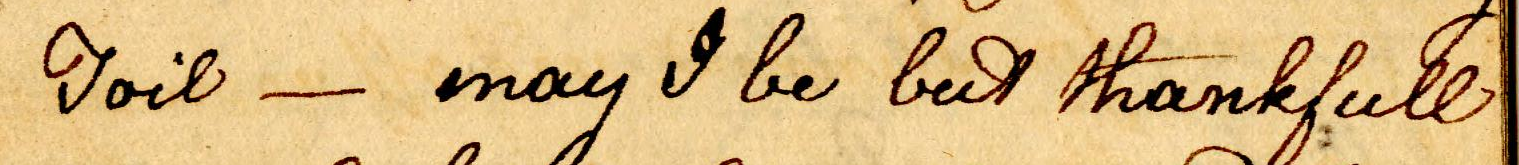Toil- may I be but thankfull
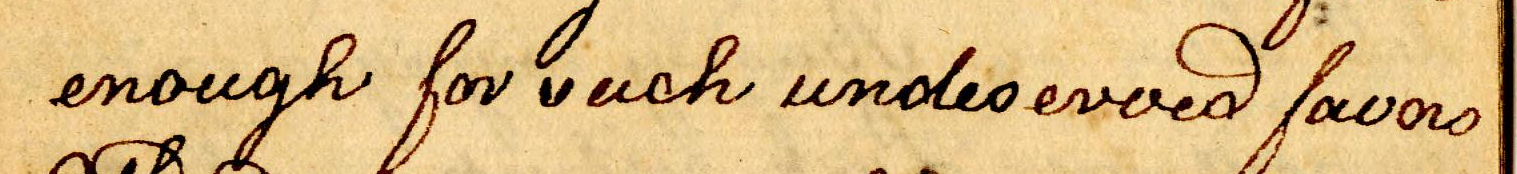enough for such undeserved favors
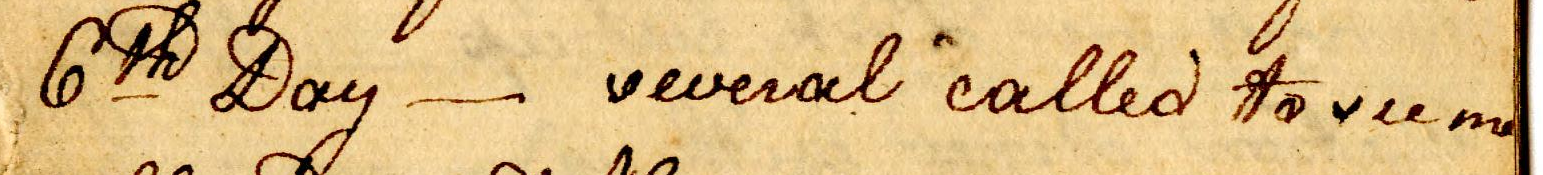6^th Day- several called to seem
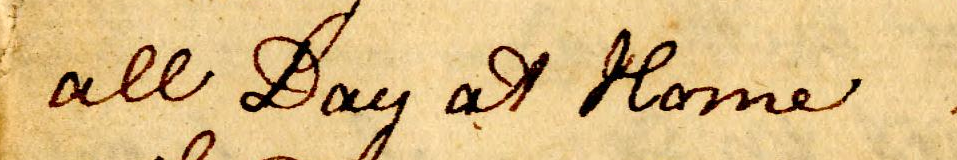all Day at Home
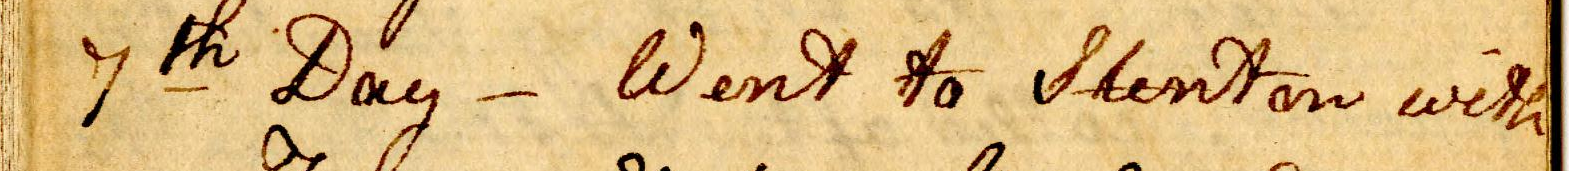7^th Day- Went to Stenton with
